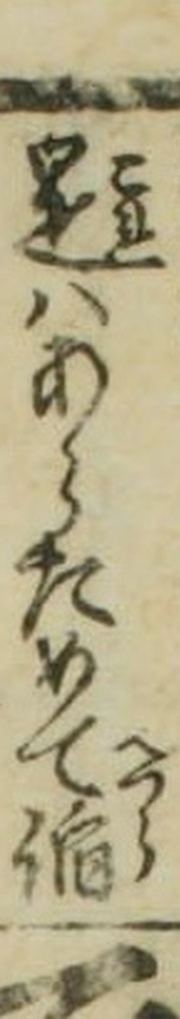是はあらためて諂
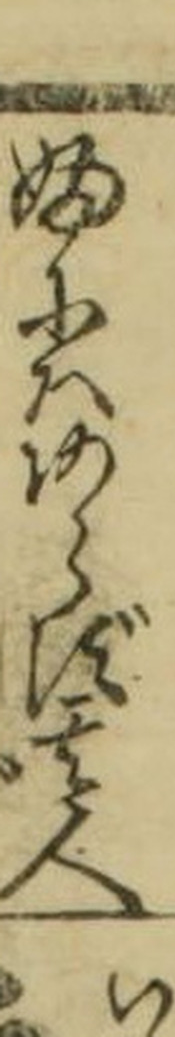ふにはあらず其人
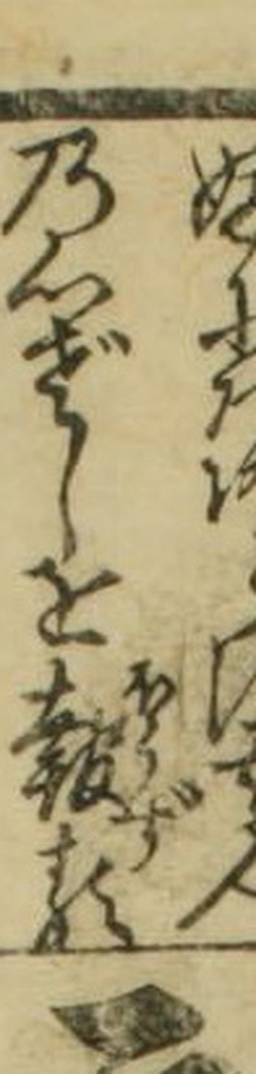の心ざしを報る
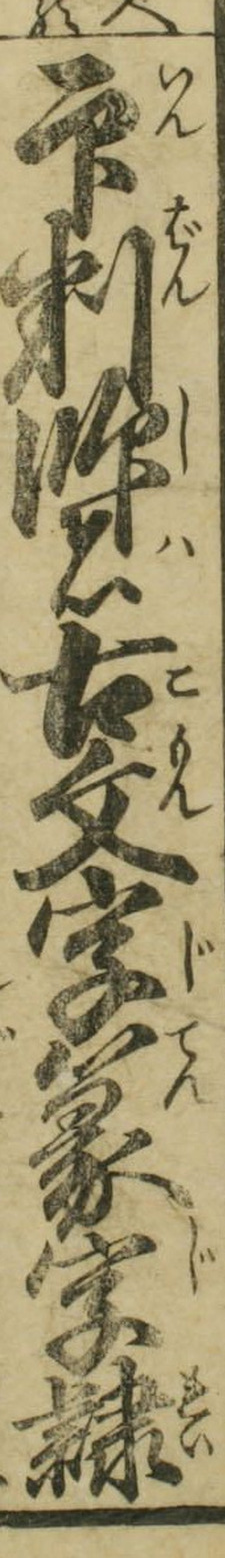印判師者古文字篆字隷
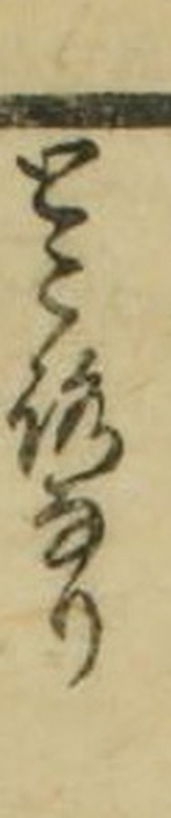ところなり
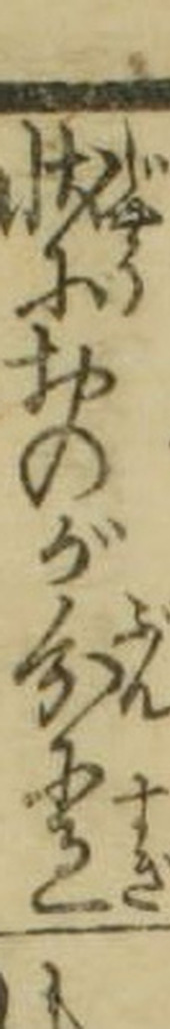状におのが分に過
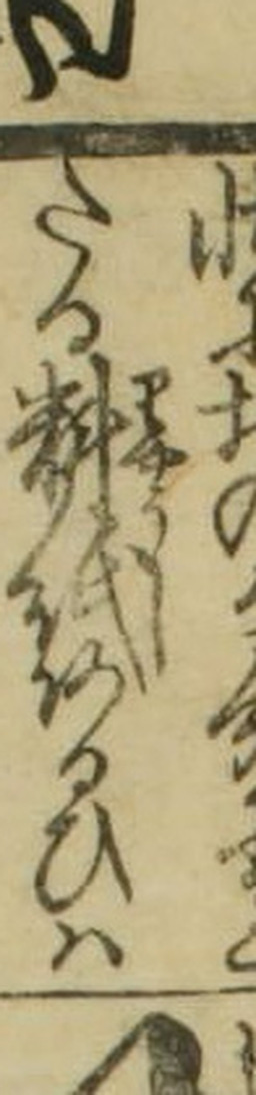たる料紙あるひは
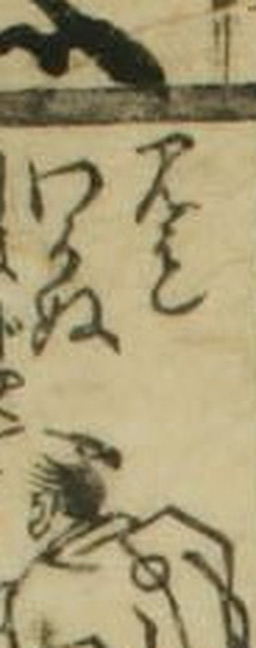わかぬ
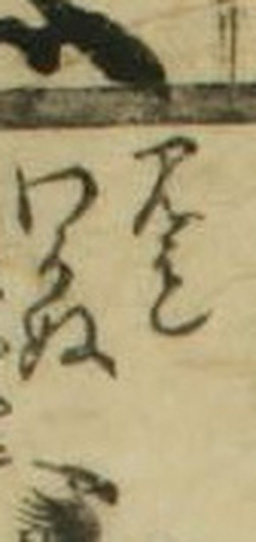わかぬ
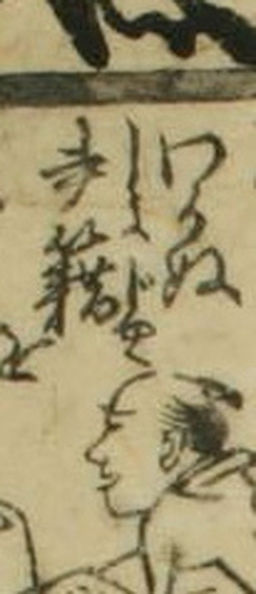書籍を
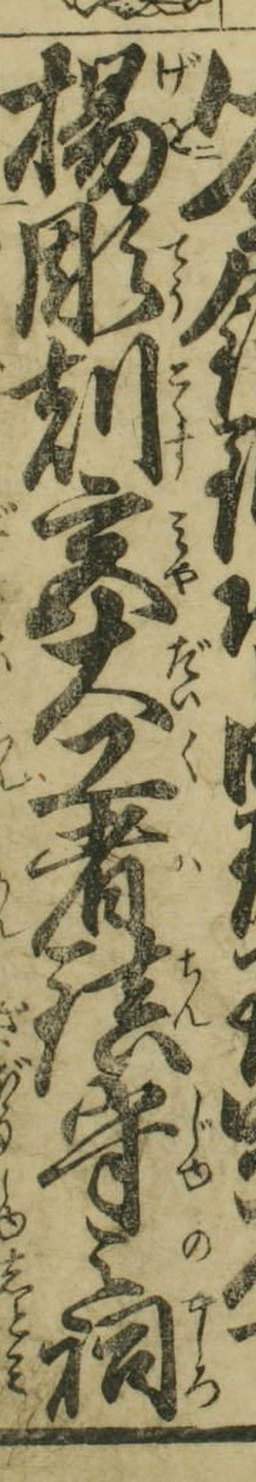楊彫刻宮大工者鎮守之祠
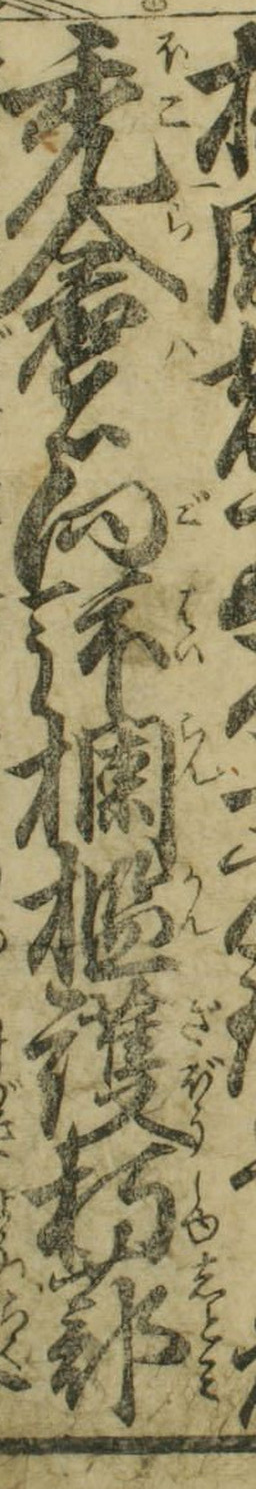禿倉者向拝欄檻護朽蔀
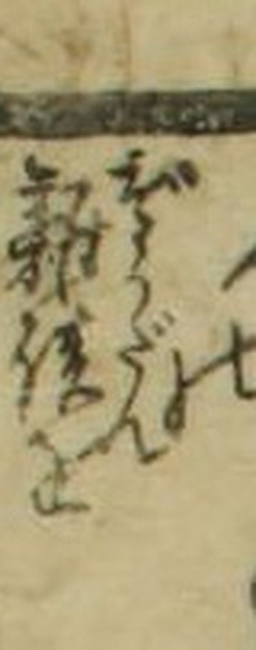雑談を

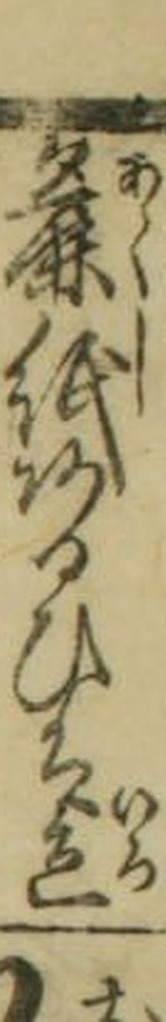麁紙あるひは色
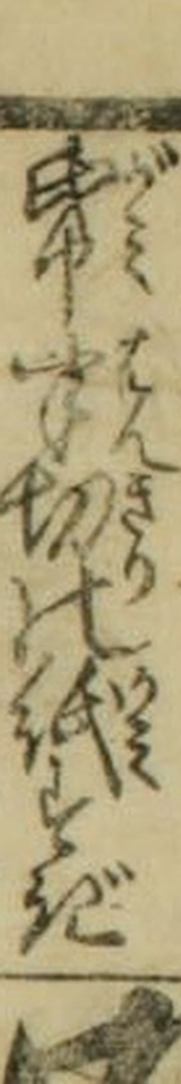帋半切の紙すぎ
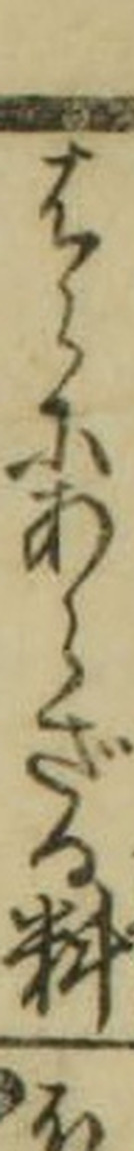はらにあらざる料
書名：増補職人往来
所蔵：東京学芸大学教育コンテンツアーカイブ
